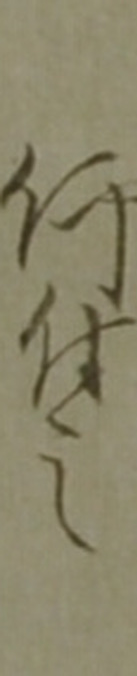仰付之
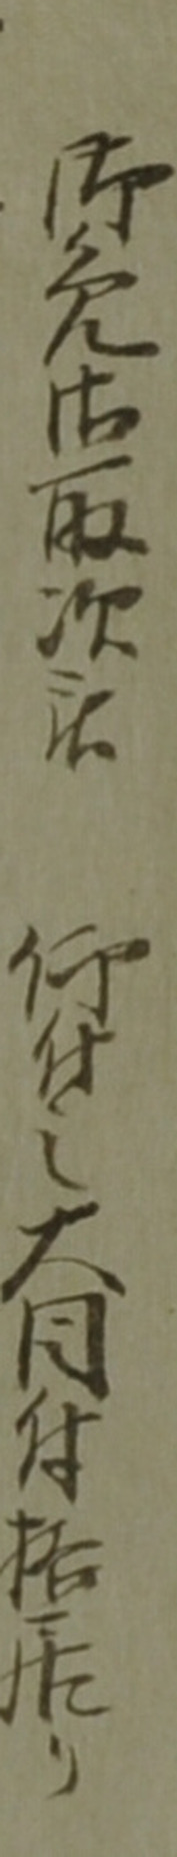御免御取次被仰付之大目付格居り
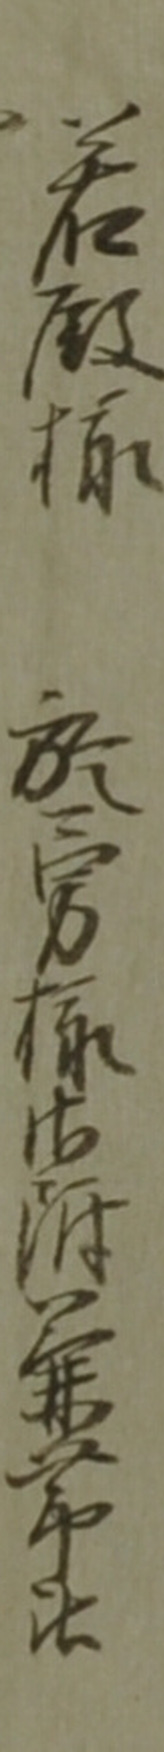若殿様於勇様御附兼帯被
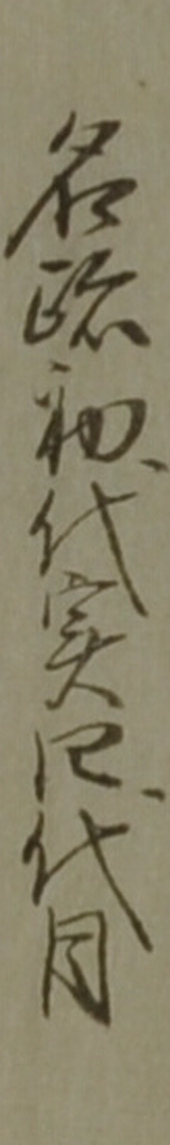名跡初代実四代目
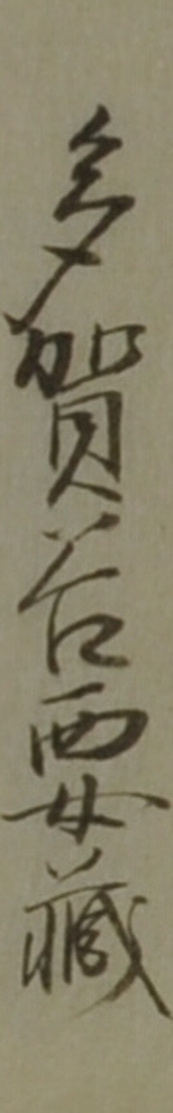多賀谷要蔵
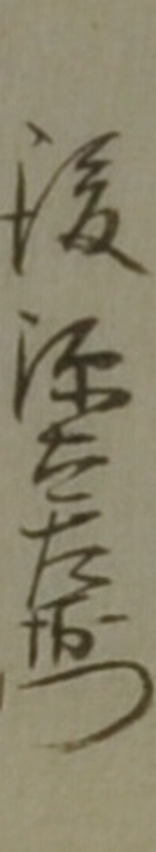後源太左衛門
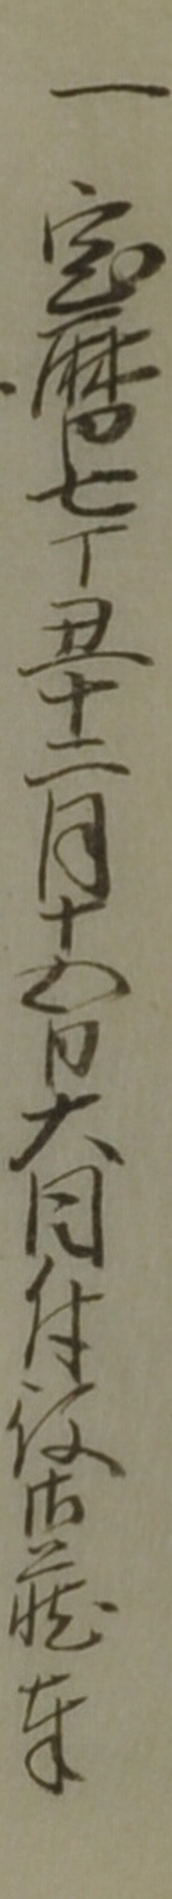一宝暦七丁丑十二月十五日大目付役御蔵奉
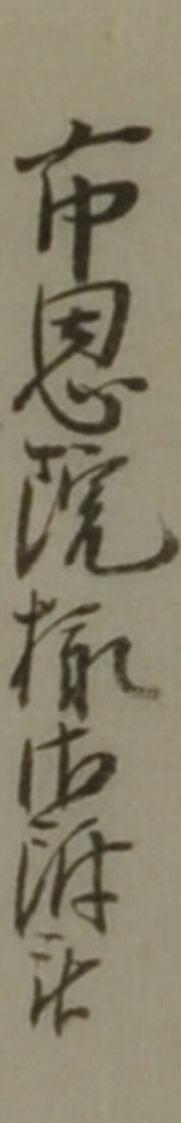布恩院様御附
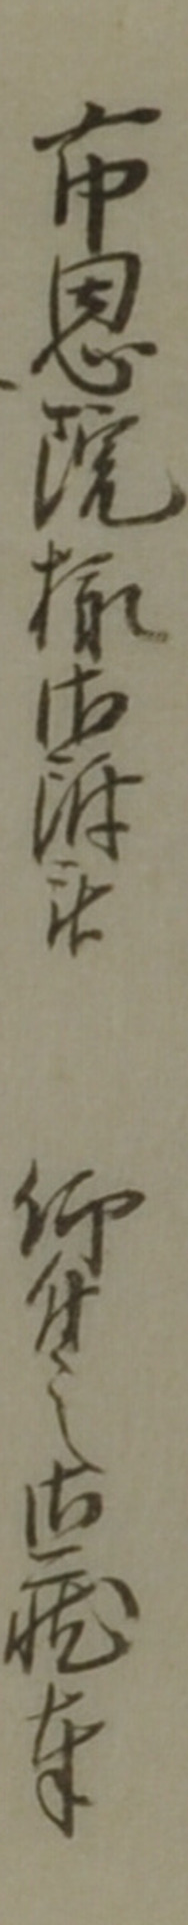布恩院様御附被仰付之御蔵奉
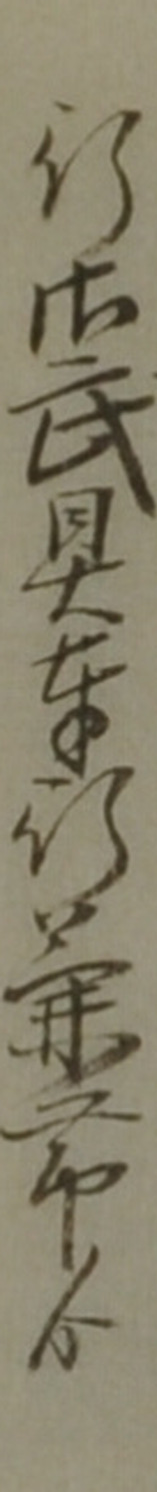行御武具奉行兼帯ゟ
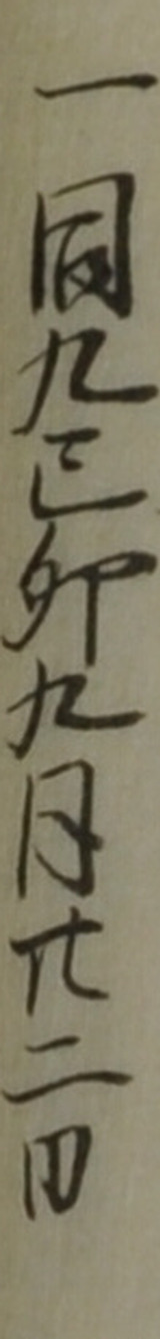一同九己卯九月廿二日
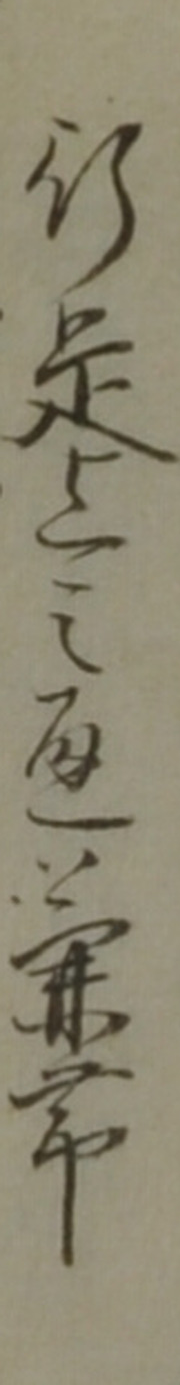行是迄之通兼帯
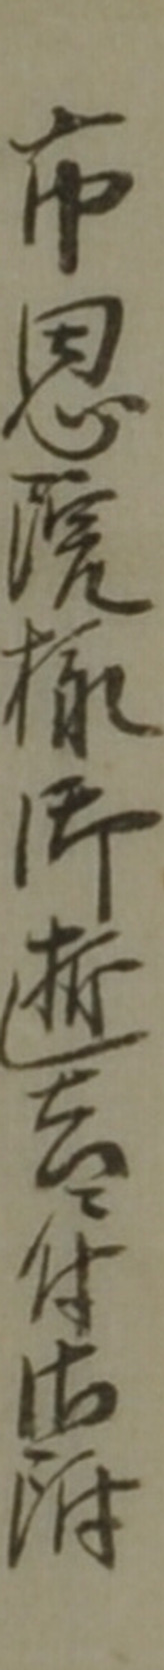布恩院様御逝去ニ付御附
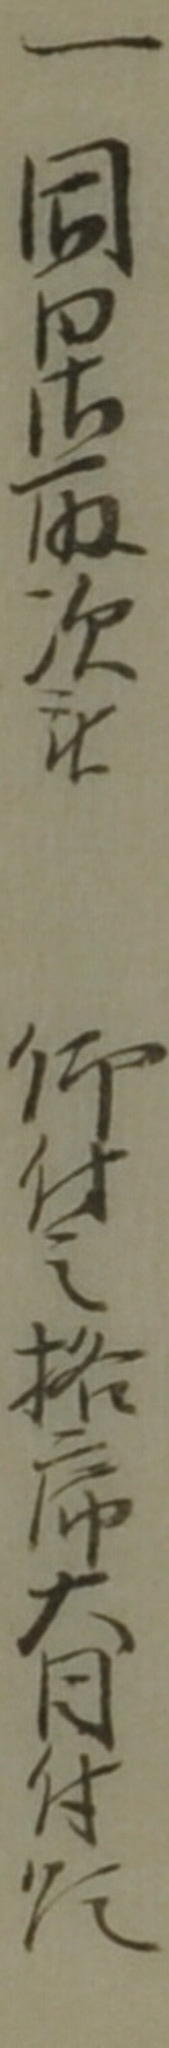一同日御取次被仰付之格席大目付順
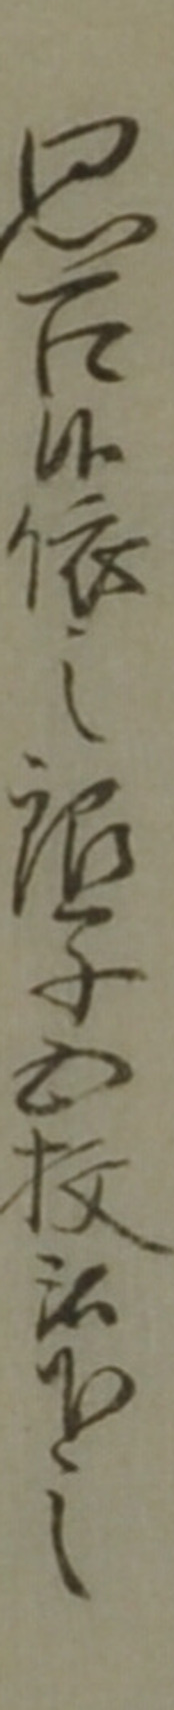思召候依之銀子五枚被下之
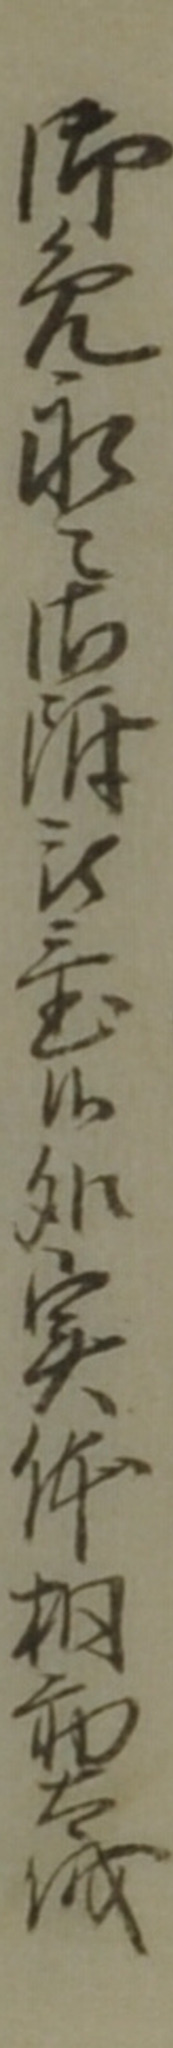御免永ニ御附被置候処実体相勤太儀
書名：諸御役代々録（六）
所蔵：伊那市立高遠町図書館・合同会社AMANE
